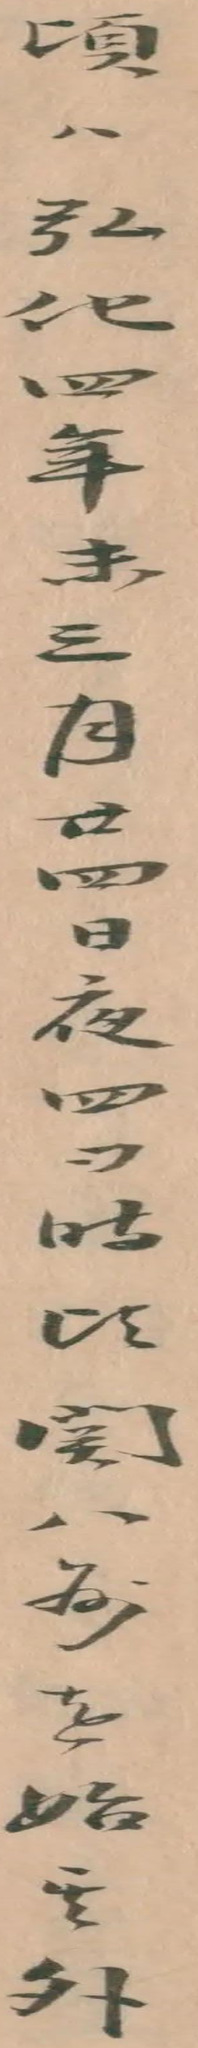頃ハ弘化四年未三月廿四日夜四ッ時頃関八州を始其外
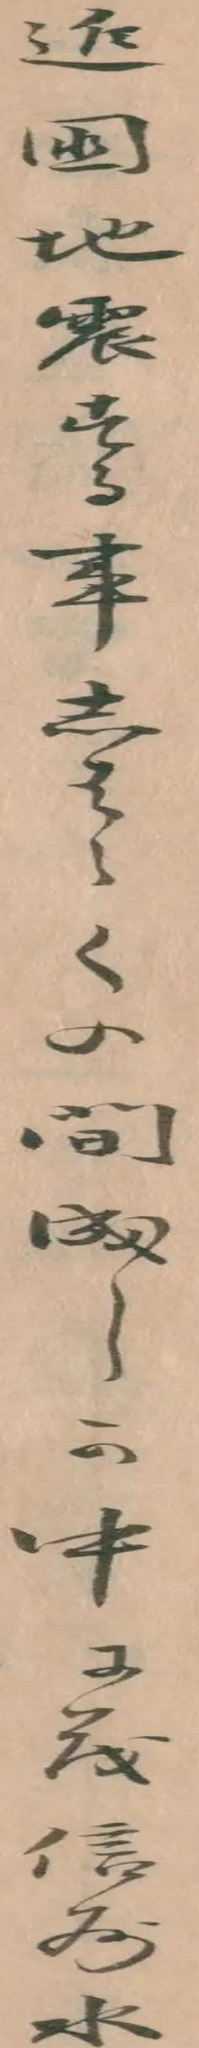近国地震する事しハらくの間成しか中にも信州水
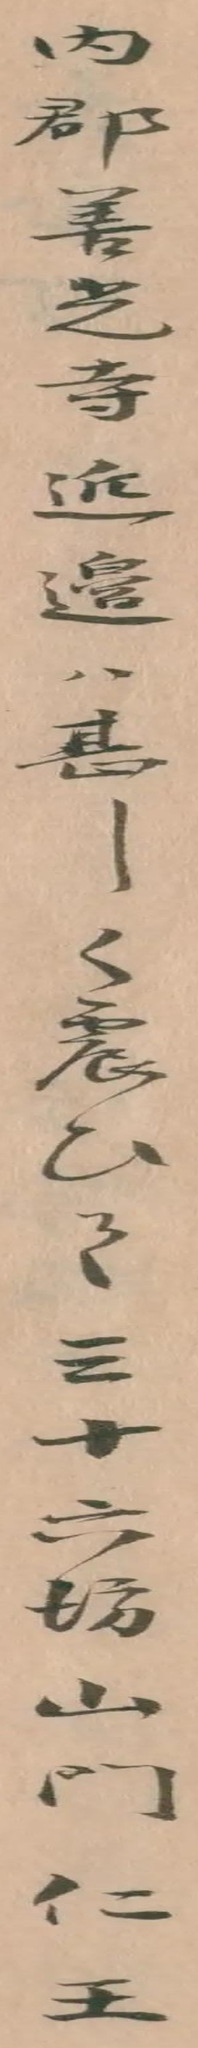内郡善光寺近辺ハ甚しく震ひて三十六坊山門仁王
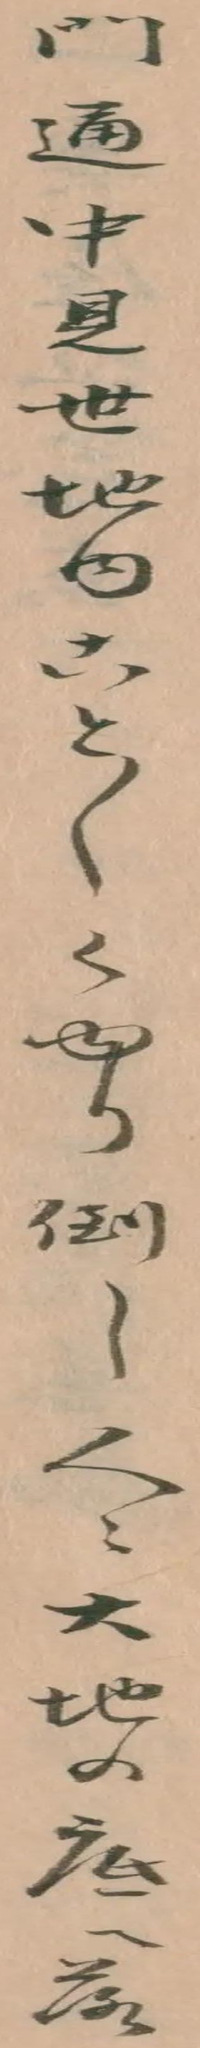門通中見せ地内こと〳〵くゆり倒し人々大地の底へ落
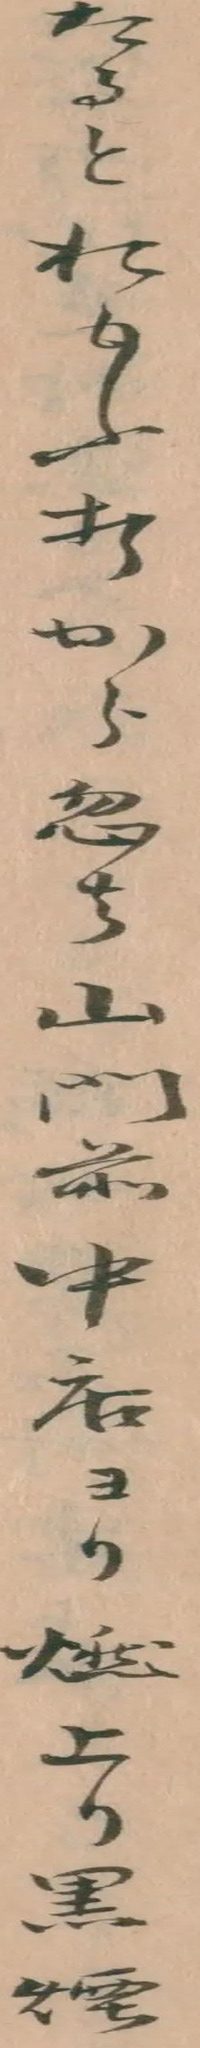たりとおもふ折から忽ち山門前中店ヨり燃上り黒煙
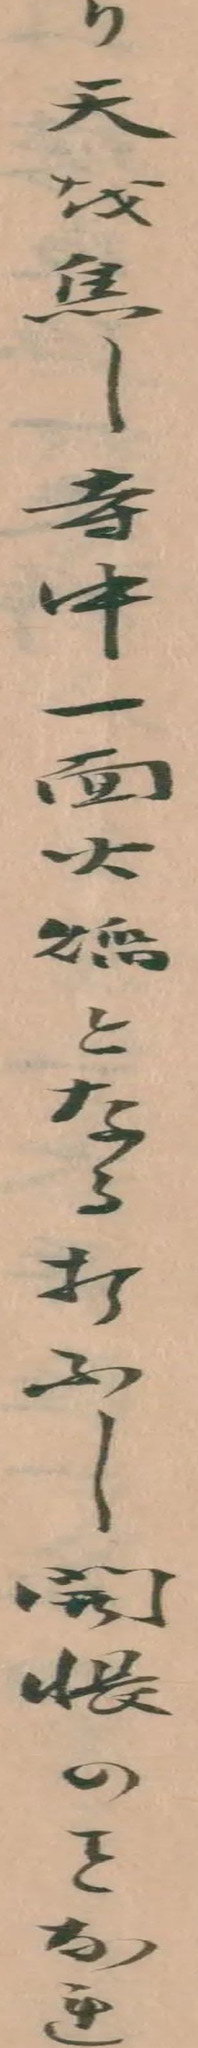り天を焦し寺中一面火焔となる折ふし開帳のことなれ
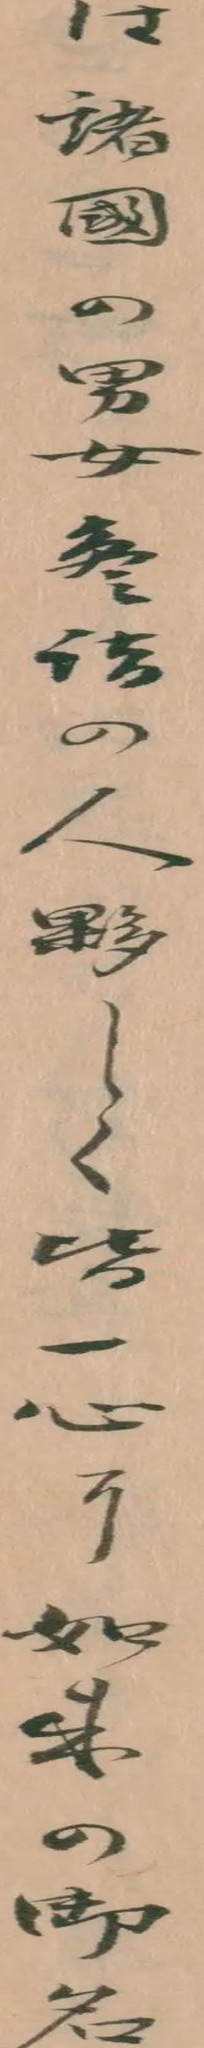は諸国の男女参詣の人夥しく皆一心に如来の御名
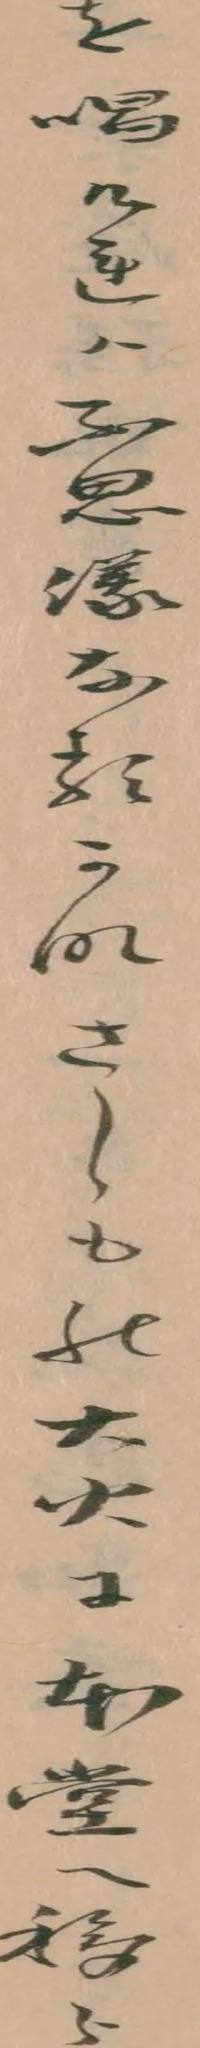を唱けれハ不思議なるかなさしもの大火に本堂へ移る
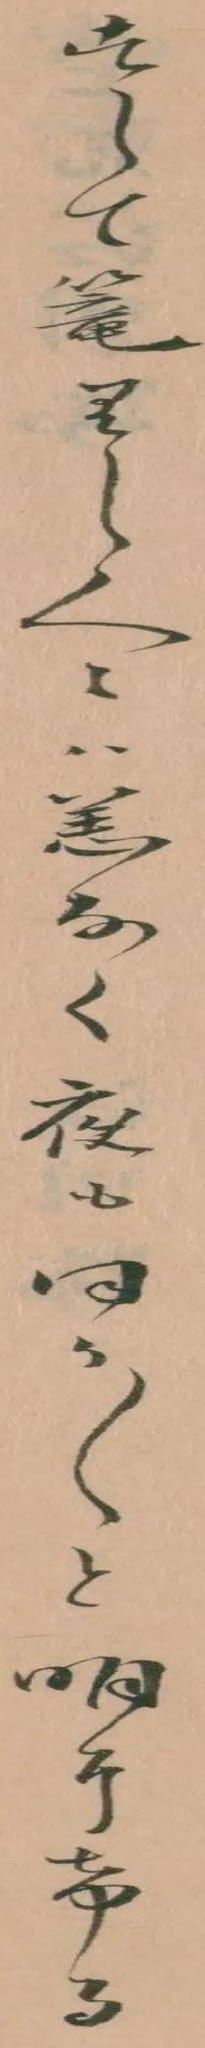ぞして篭りし人々ハ恙なく夜もほの〳〵とあ明にける
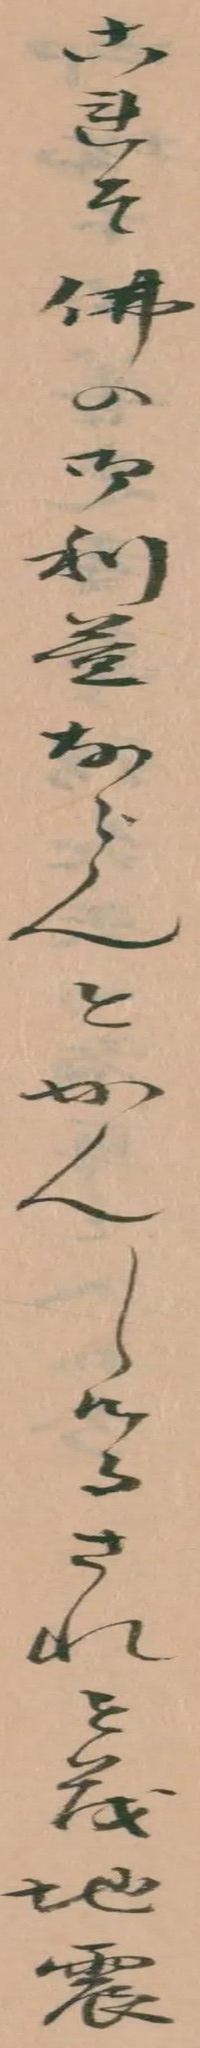これそ仏の御利益ならんと感しけるされとも地震
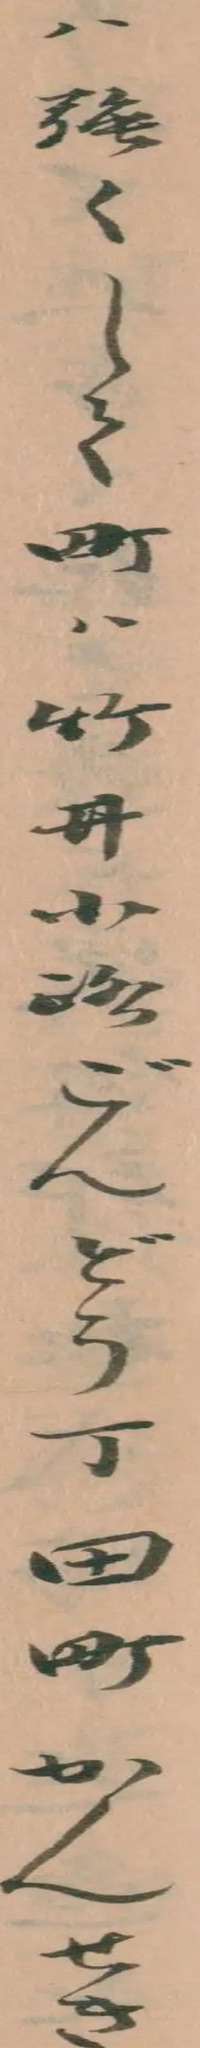ハ強くして町ハ竹井小路ごんどう丁田丁がんせき
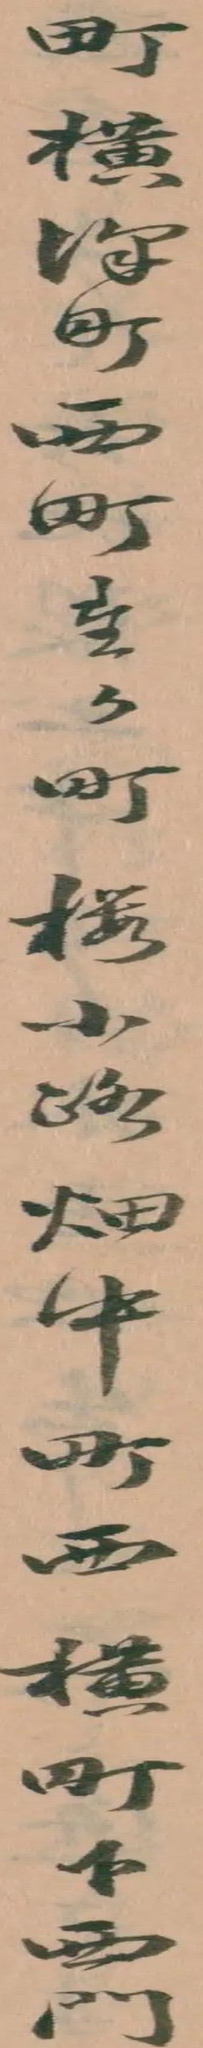町横沢町西町たか町桜小路畑中町西横町下西門
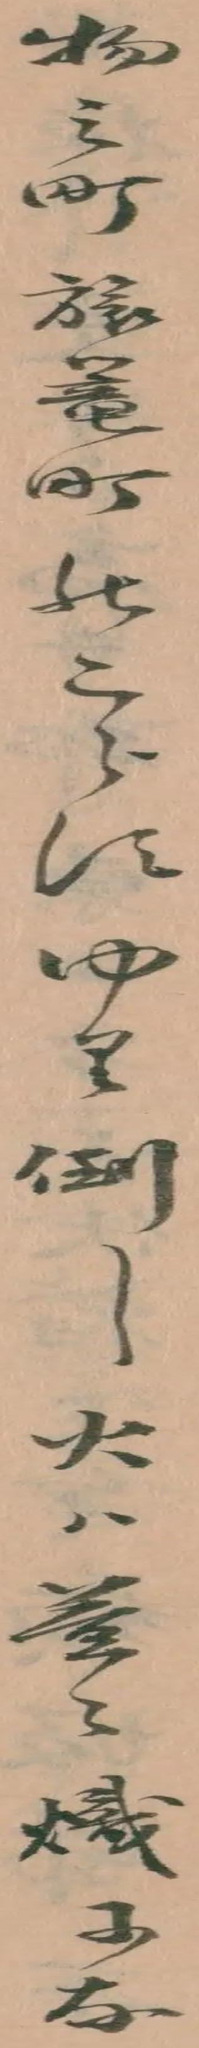物ミ町旅籠町のこらすゆり倒し火ハ益々熾にな
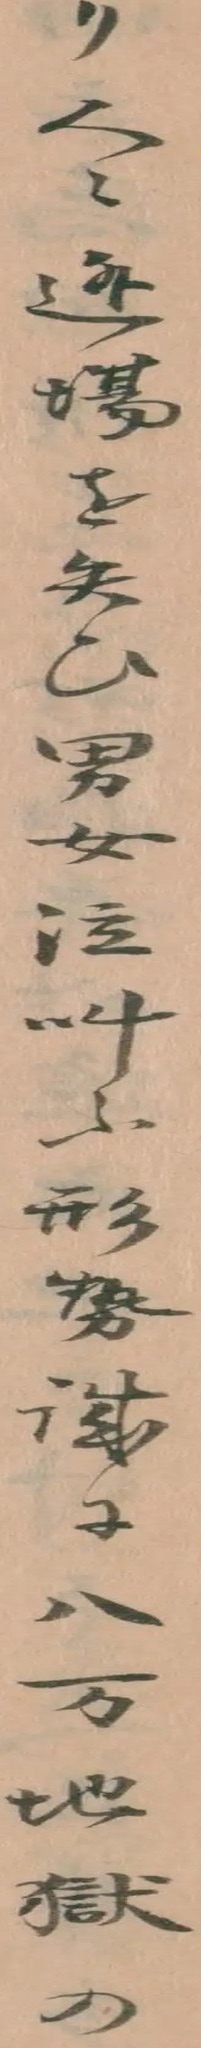り人々逃場を失ひ男女泣叫ふ形勢誠に八方地獄の
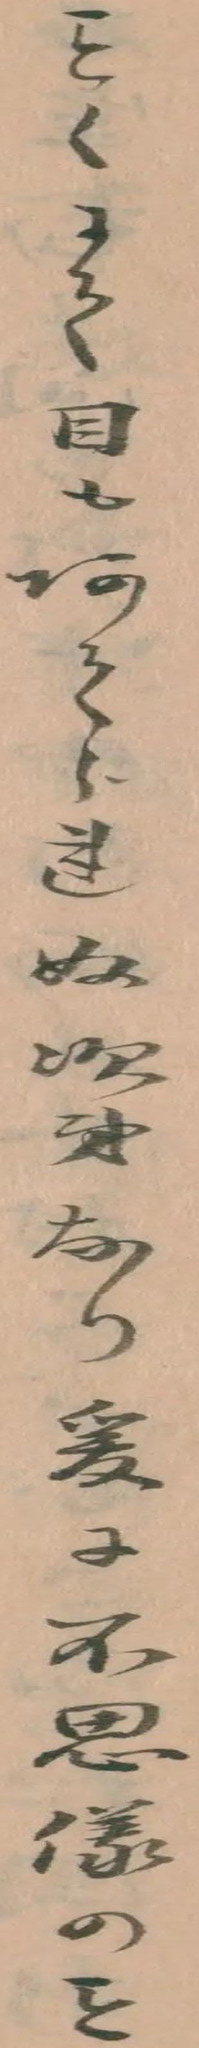ことくにて目もあてられぬ次第なり爰に不思議のこと
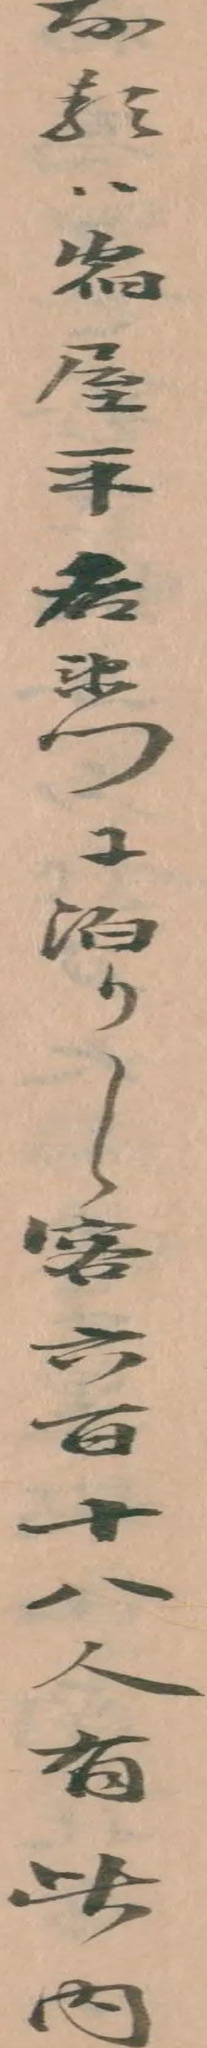なるハ宿屋平左衛門所に泊りし客六百十八人有此内
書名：地災撮要. 巻3(地震之部)-巻4(噴火之部)
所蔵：国立国会図書館 National Diet Library, JAPAN
